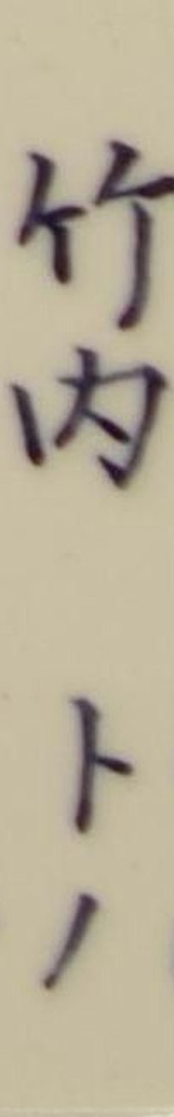竹内トノ
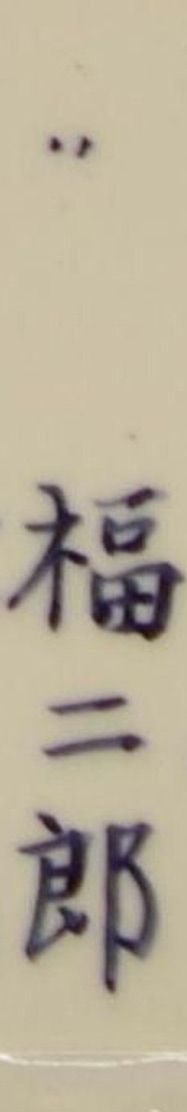福二郎
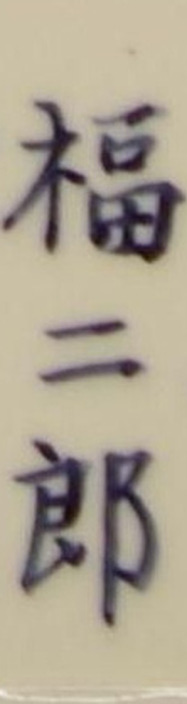福二郎
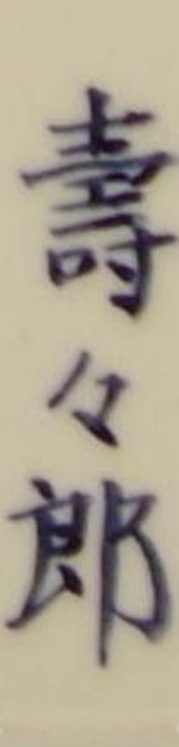壽々郎
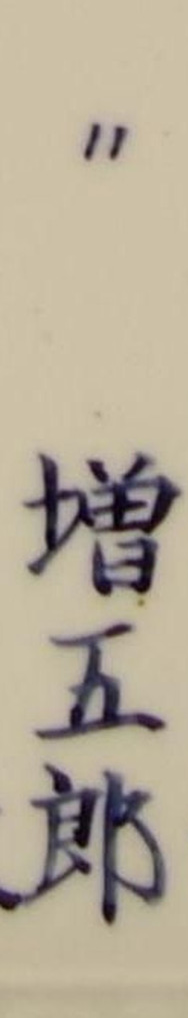増五郎
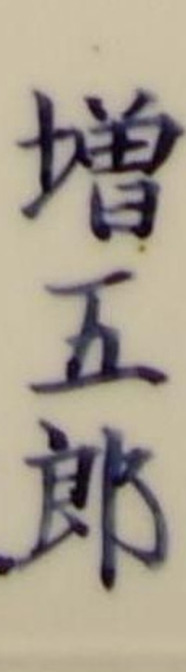増五郎
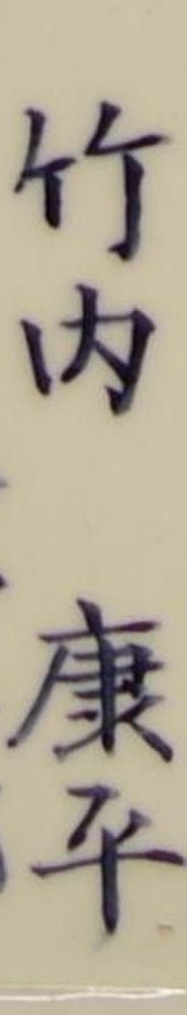竹内康平
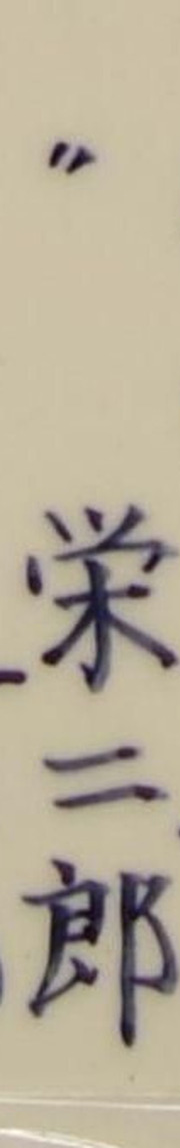栄二郎
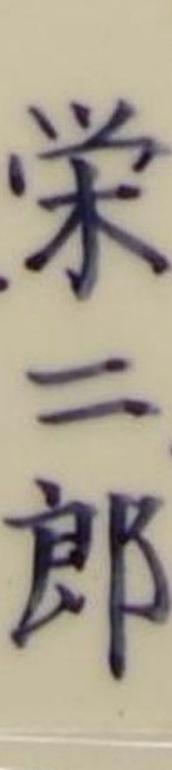栄二郎
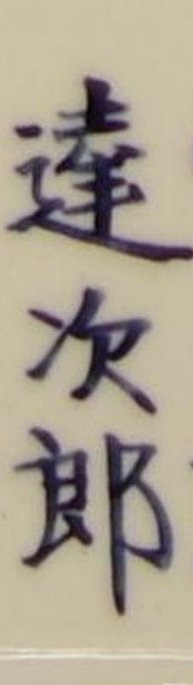達次郎
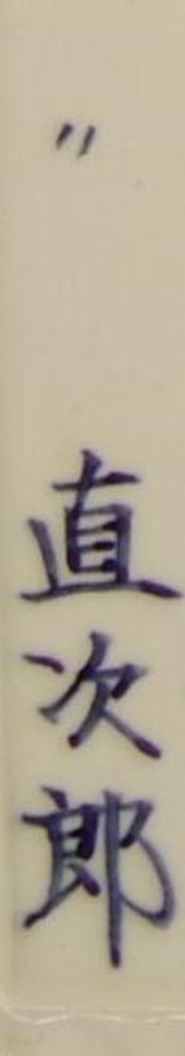直次郎
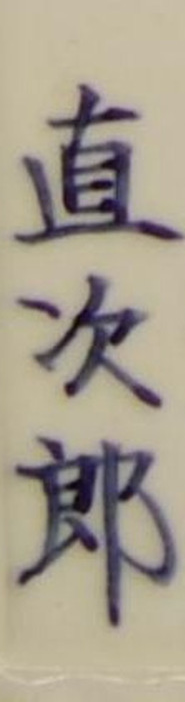直次郎

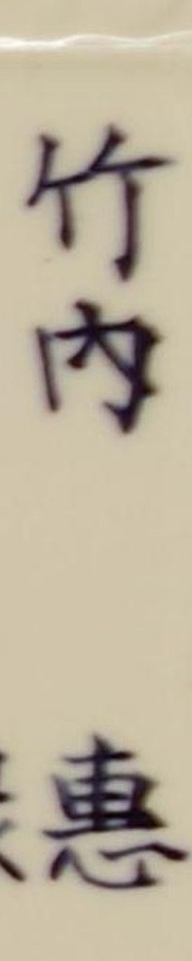竹内恵
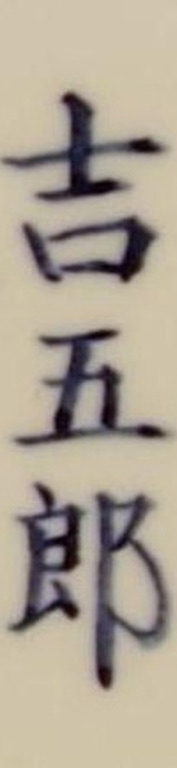吉五郎
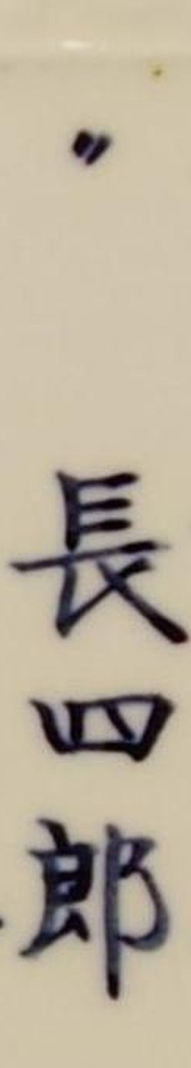長四郎
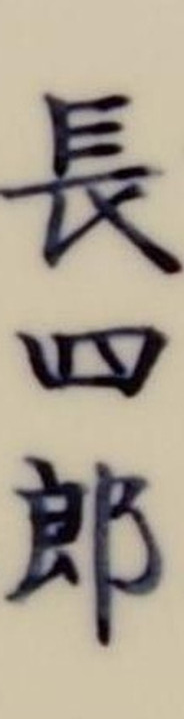長四郎
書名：E~L
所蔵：高野山金剛峯寺
